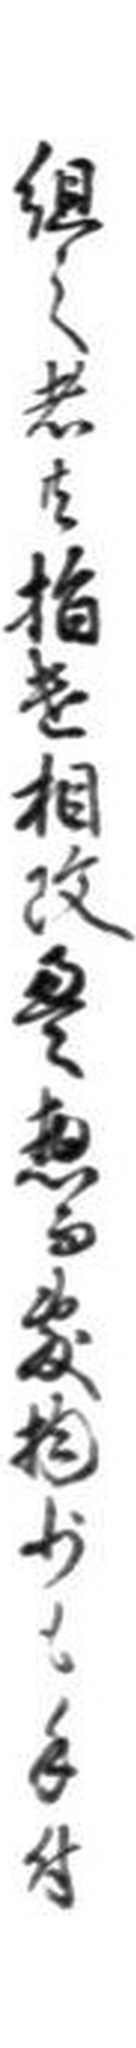組之者共指遣相改畳惣而敷物少も手付
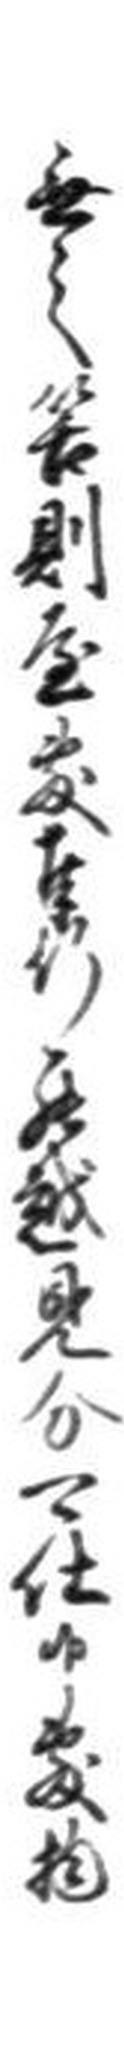無之筈則屋敷奉行罷越見分可仕候敷物
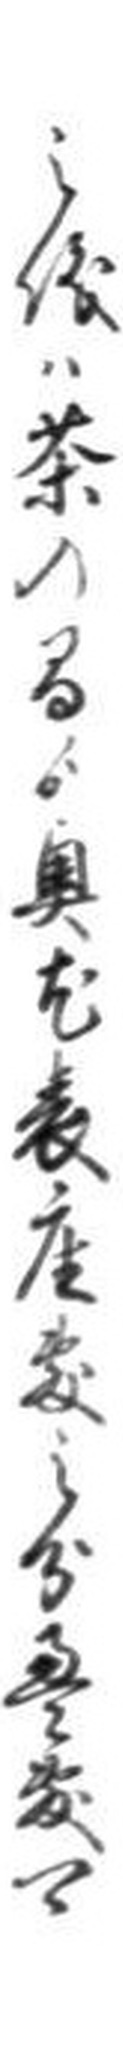之儀ハ茶の間ゟ奥尤表座敷之分畳敷可
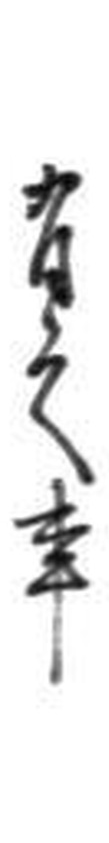有之事
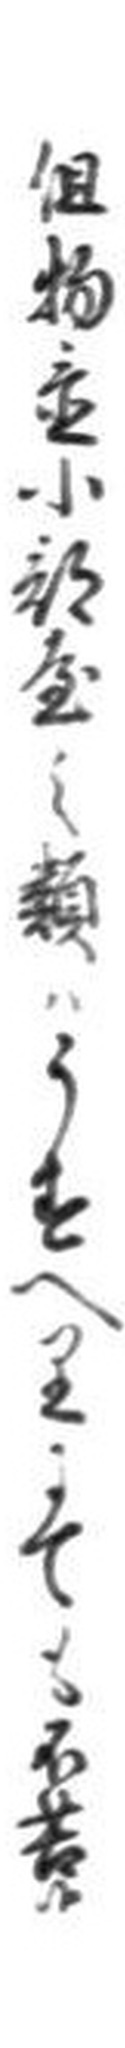但物置小部屋之類ハうすへりにても不苦候
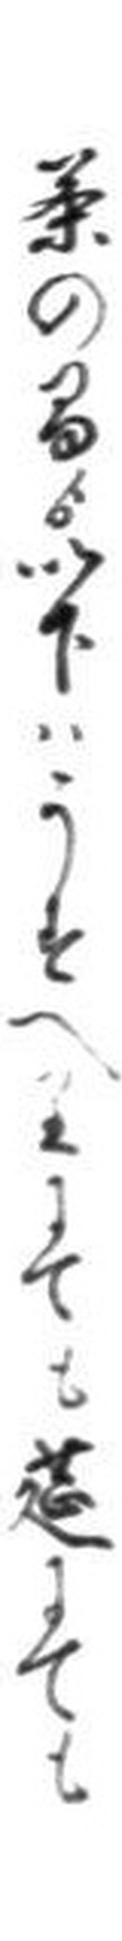茶の間ゟ以下ハうすへりにても筵にても
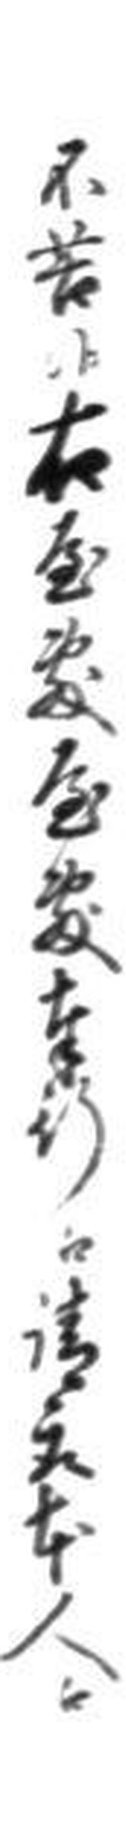不苦候右屋敷屋敷奉行江請取本人江
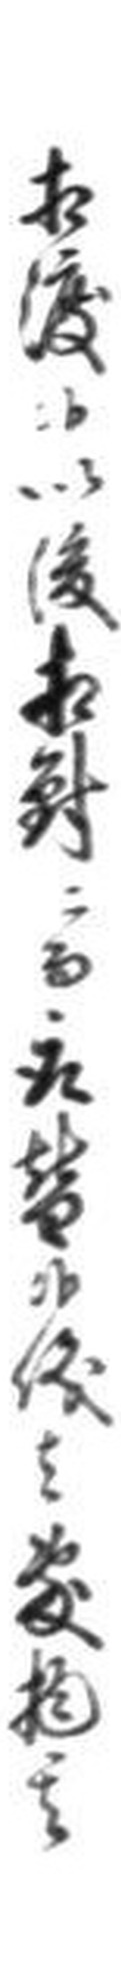相渡候以後相対ニ而取替候儀者敷物其
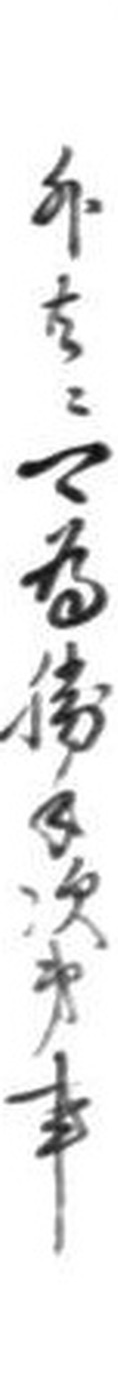外共ニ可為勝手次第事

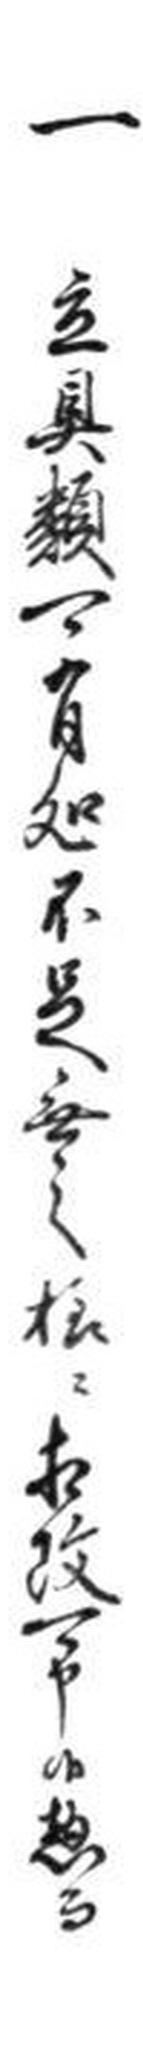一立具類可有処不足無之様ニ相改可申候惣而
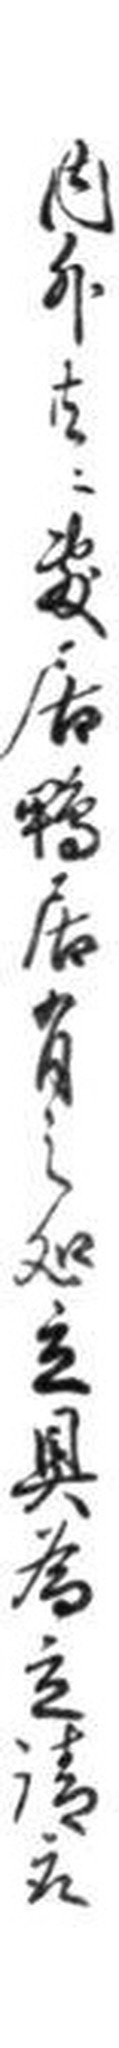内外共ニ敷居鴨居有之処立具為立請取
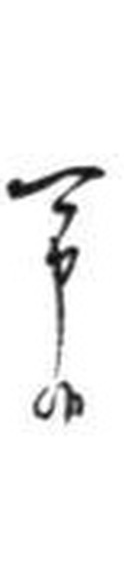可申候
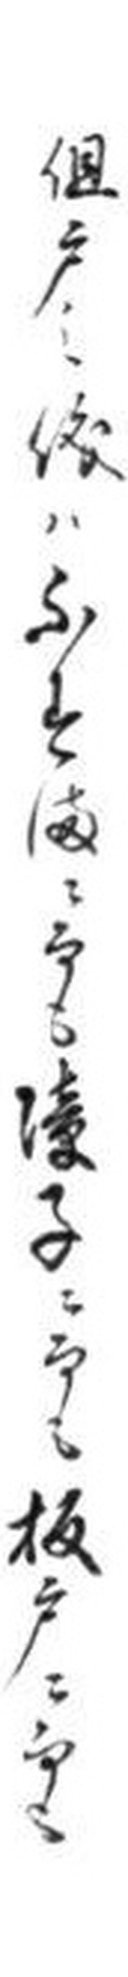但戸之儀ハふすまニ而も障子ニ而も板戸ニ而も
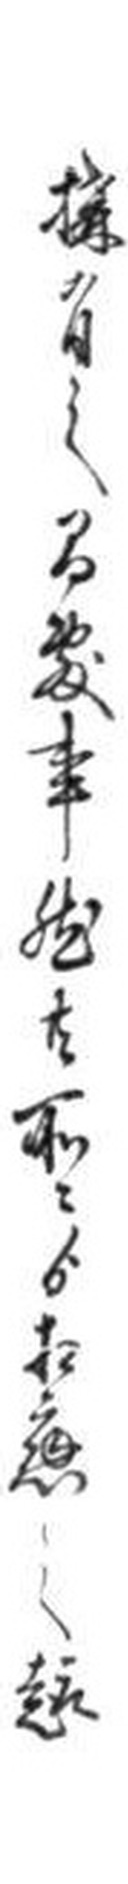構有之間敷事然共所ニゟ相応之趣
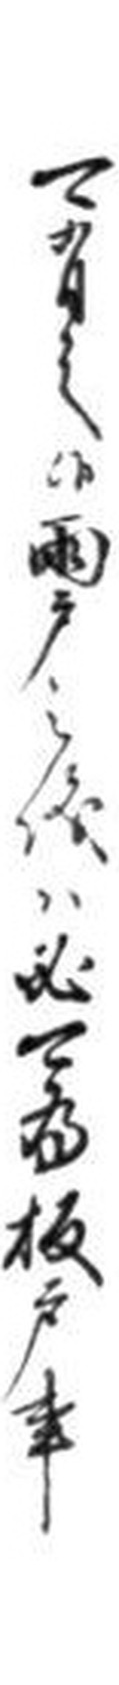可有之候雨戸之儀ハ必可為板戸事
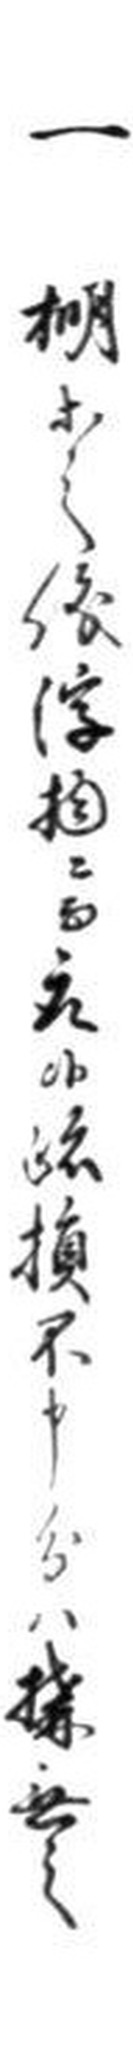一棚等之儀浮物ニ而取候跡損不申分ハ構無之
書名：家譜 三十二 吉邦公 従享保二年到享保三年
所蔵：福井県文書館 Fukui Prefectural Archives
